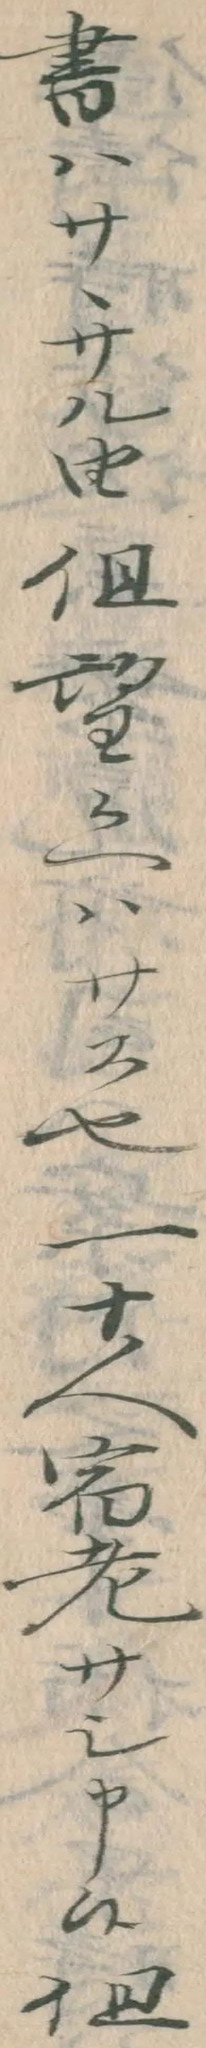書ハサヽサル由但望候へハサス也一十人宿老サシ申候但
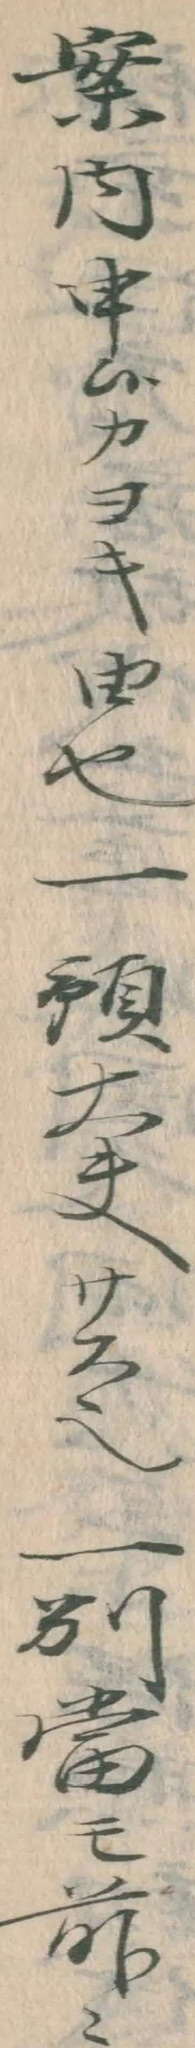案内申候カヨキ由也一預大夫サス也一別当モ前々
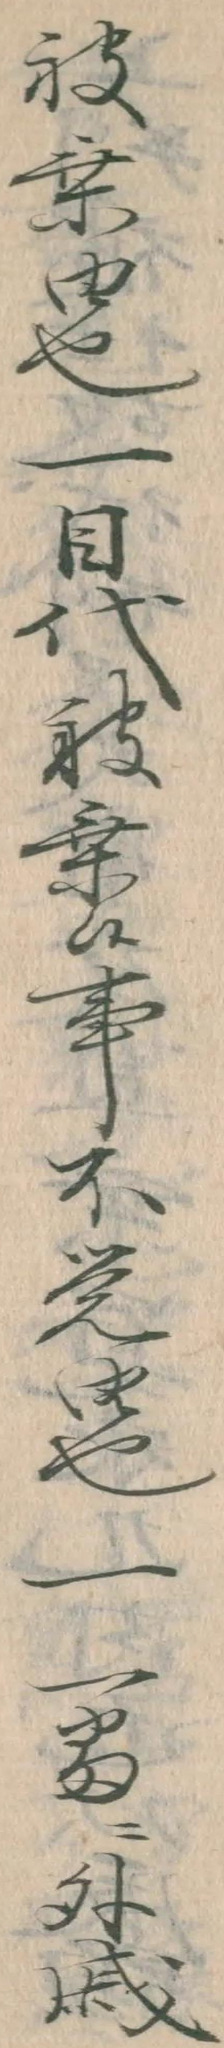被乗由也一目代被乗候事不覚由也一番ニ外戚
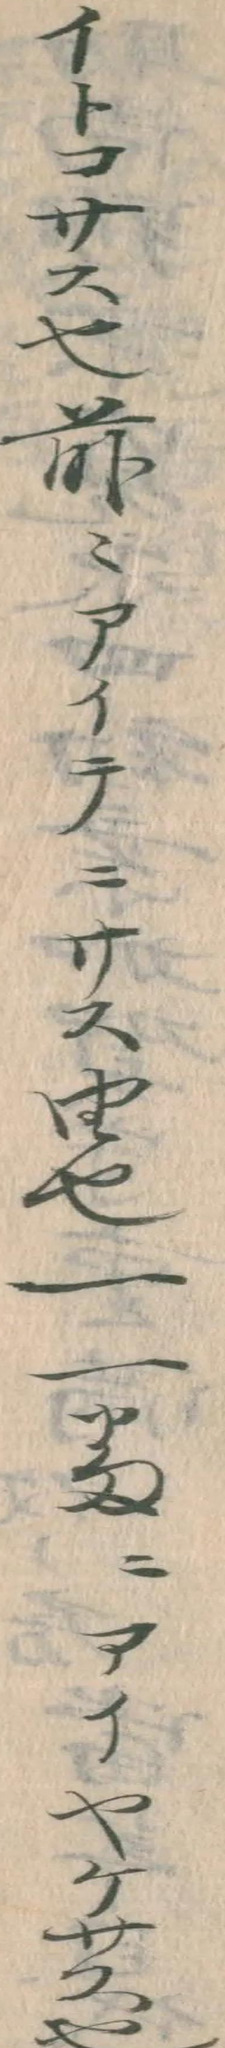イトコサス也前々アイテニサス由也一一番ニアイヤケサス也
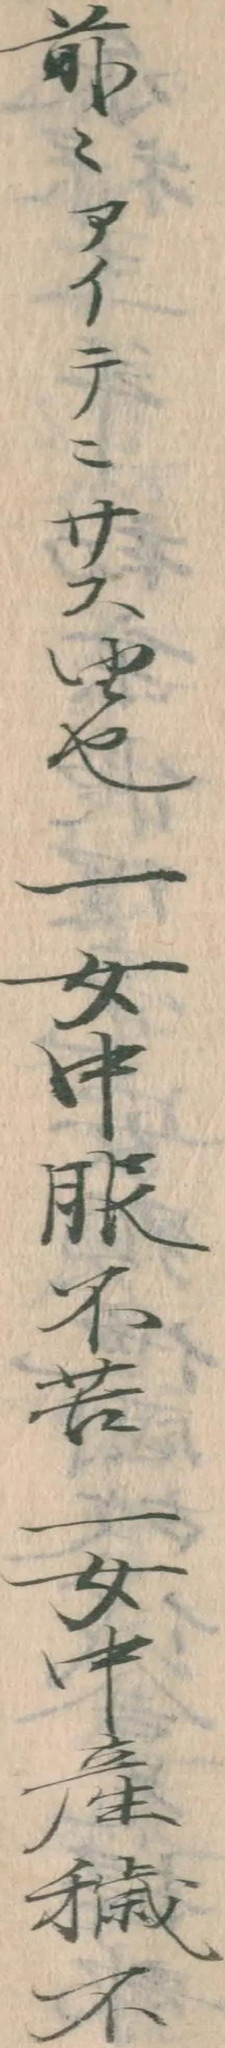前々アイテニサス由也一女中服不苦一女仲産穢不
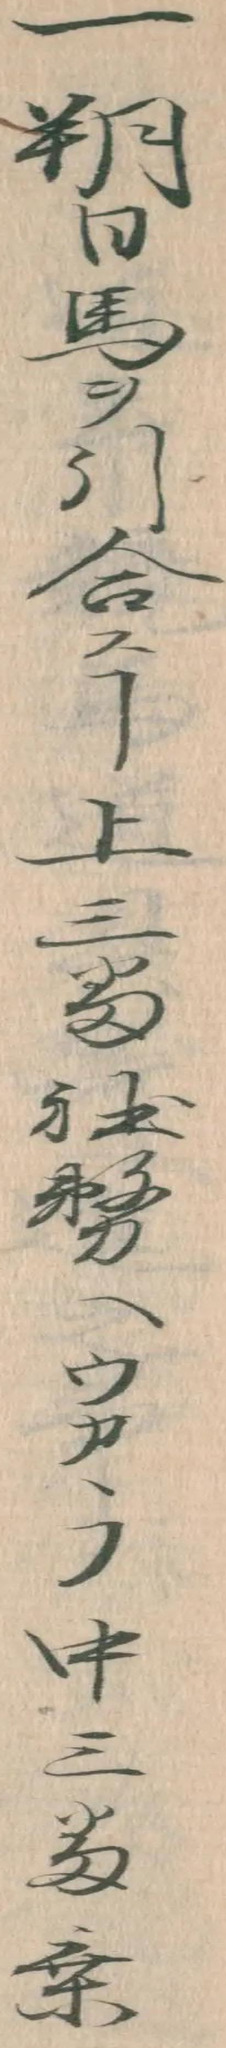一朔日馬ヲ引合スコト上三番社務ヘウカヽフ中三番乗
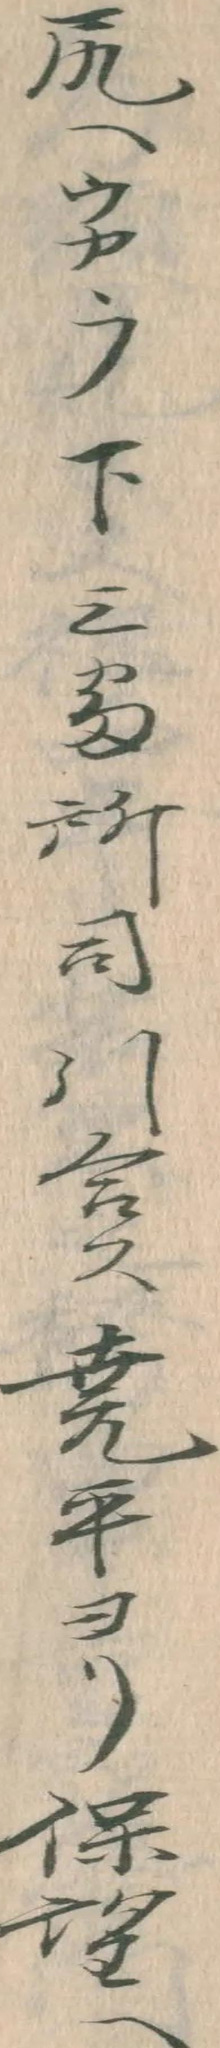尻ヘウカヽフ下三番所司引合ス尭平ヨリ保望ヘ
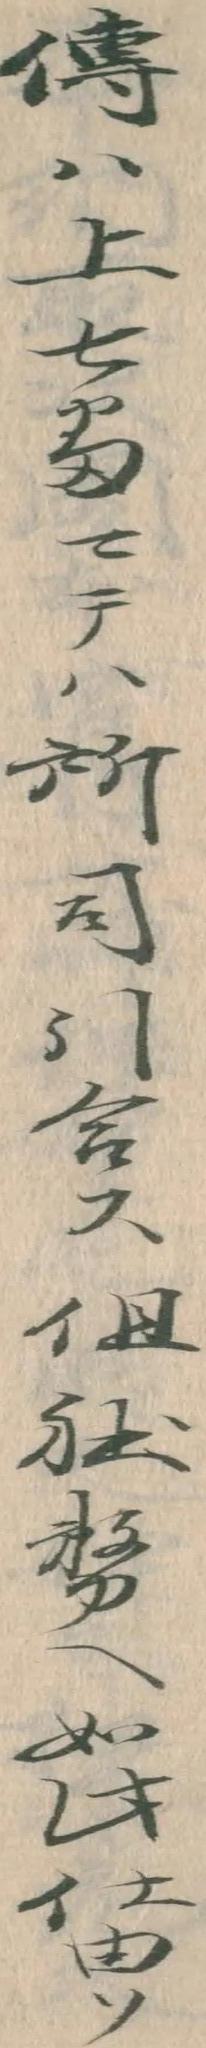伝ハ上七番マテハ所司引合ス但社務へ如此仕由ソ
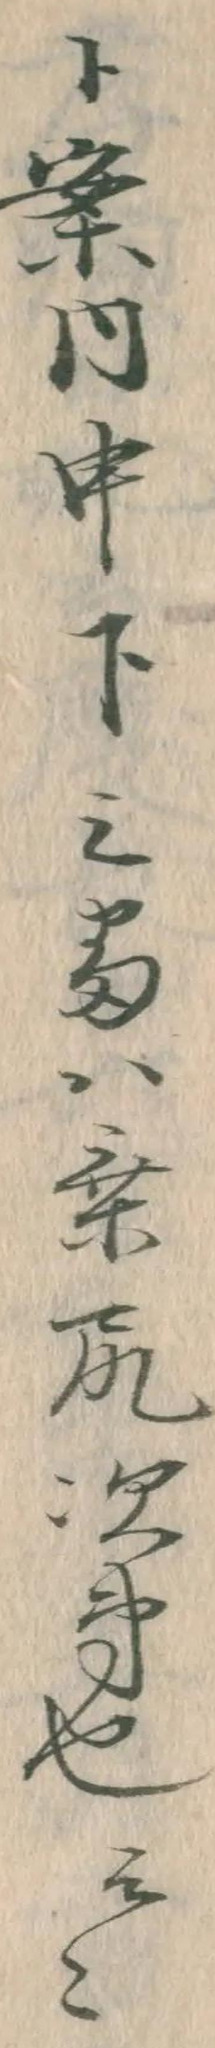ト案内申下三番ハ乗尻次第也云々

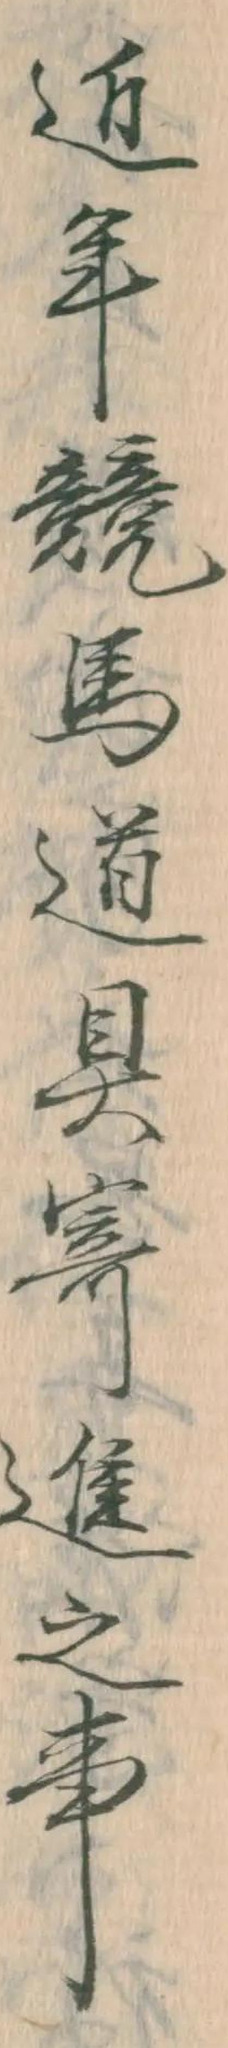近年競馬道具寄進之事
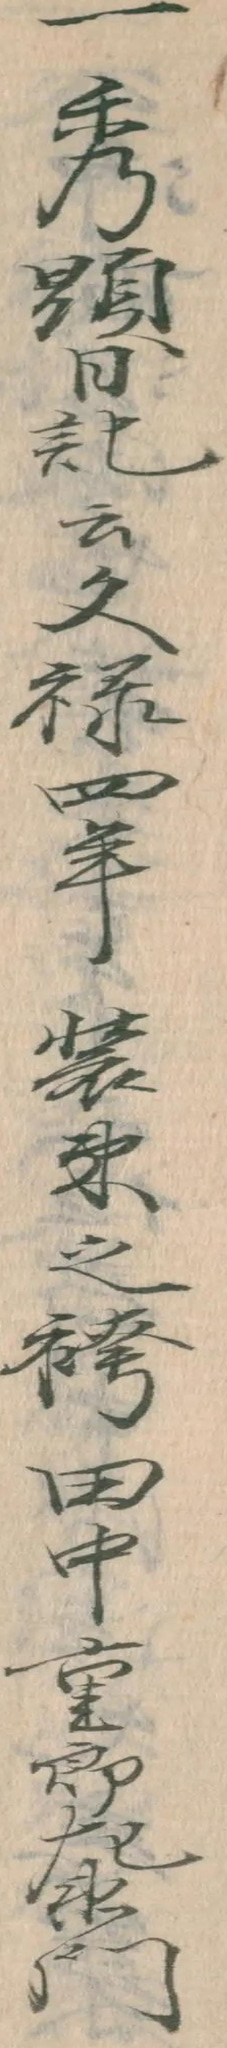一秀顕日記云文禄四年装束之袴田中重郎左衛門
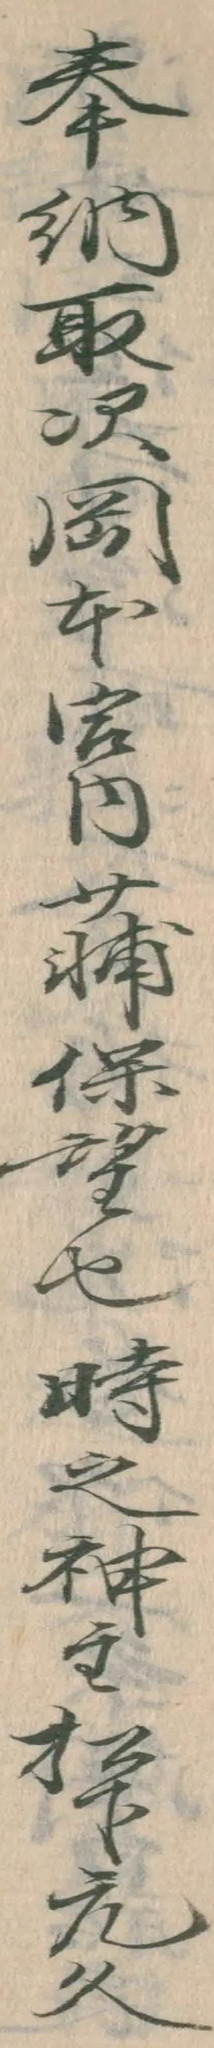奉納取次岡本宮内少輔保望也時之神主松下元久
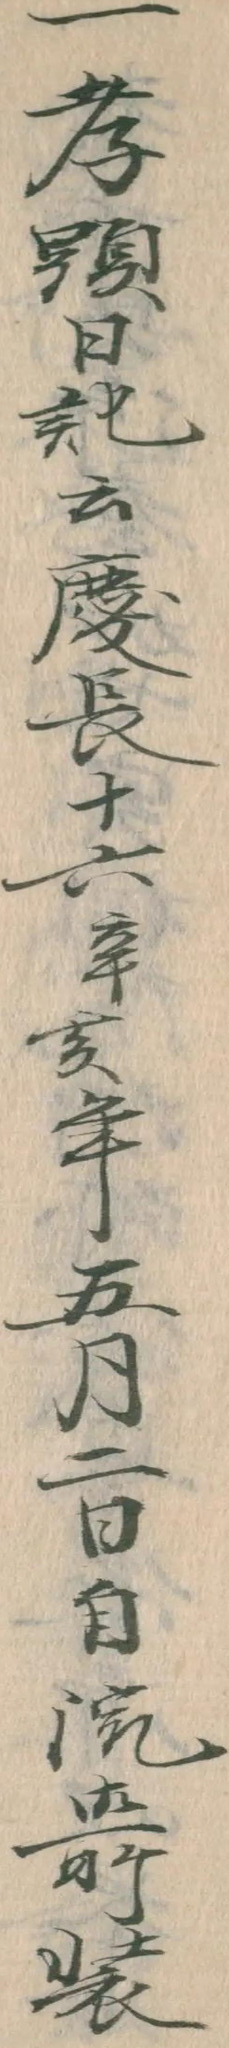一孝顕日記云慶長十六辛亥年五月二日自院御所装
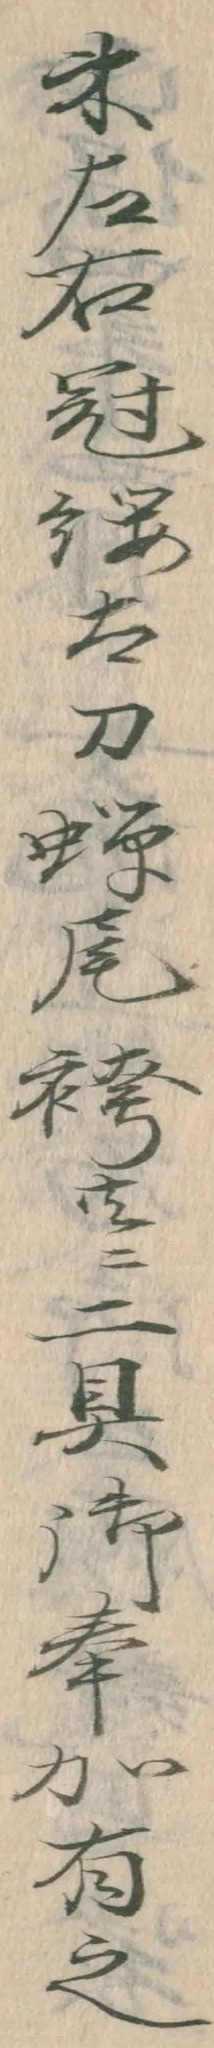束左右冠綏太刀蝉尾袴共ニ二具御奉加有之
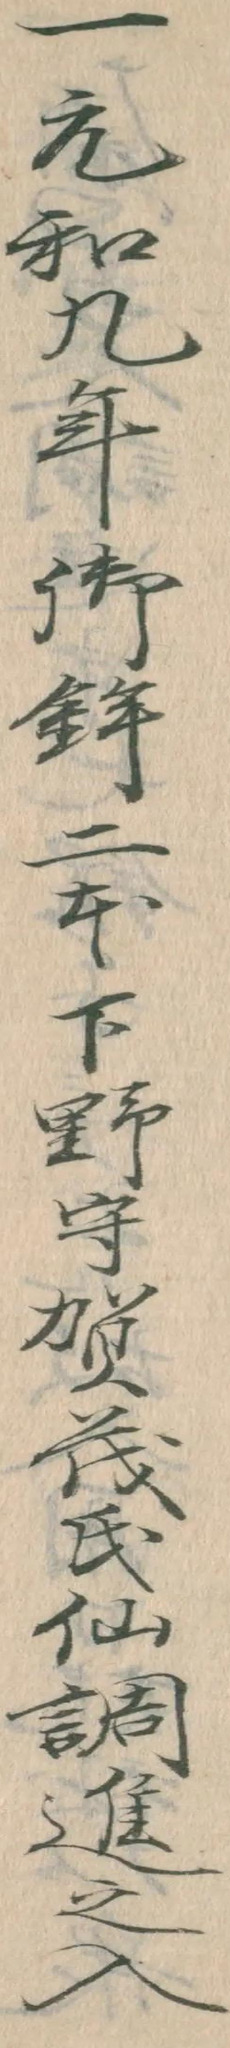一元和九年御鉾二本下野守賀茂氏仙調進之入
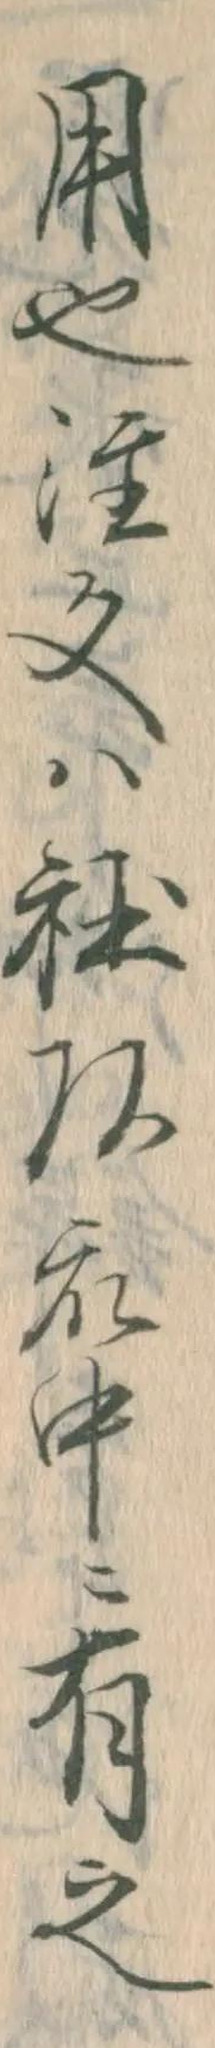用也注文ハ社頭衆中ニ有之
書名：賀茂社記録. 第11冊
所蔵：国立国会図書館 National Diet Library, JAPAN
